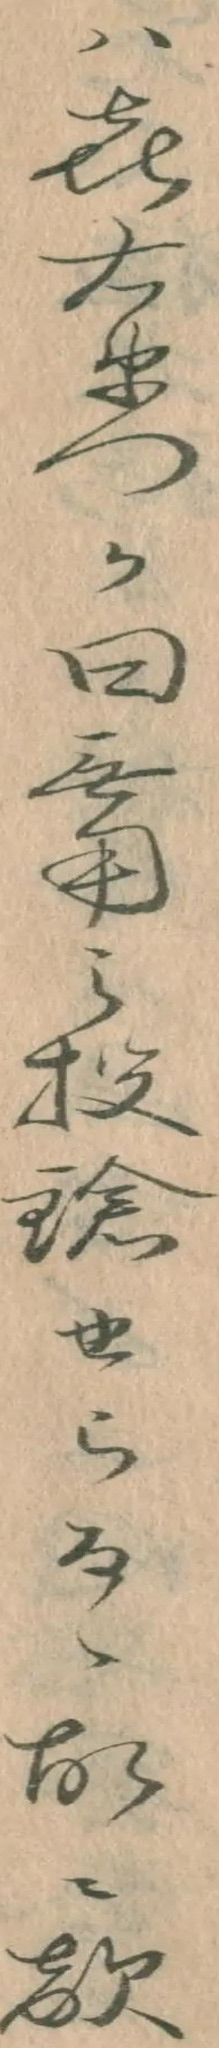は喜右衛門か曰無用之投鎗せらるゝ故に敵
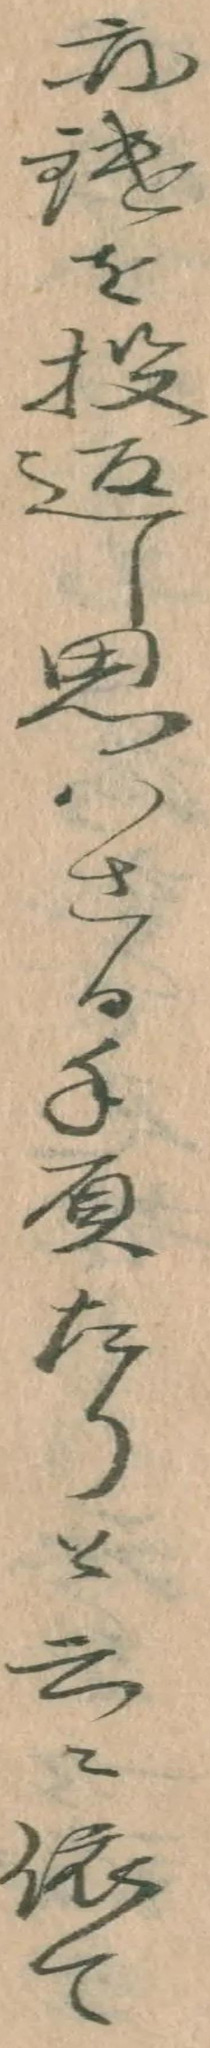亦鑓を投返し思はさる手負たりと云に依て
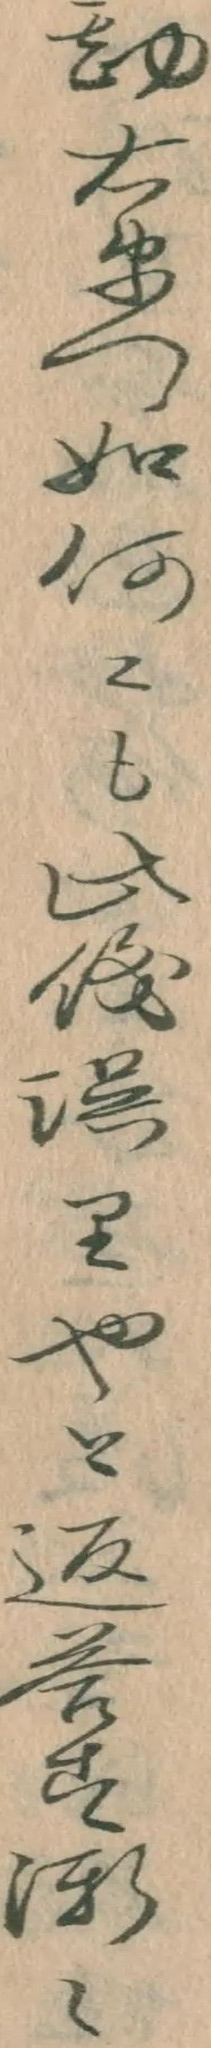勘右衛門如何にも此儀誤里也と返答春漸々
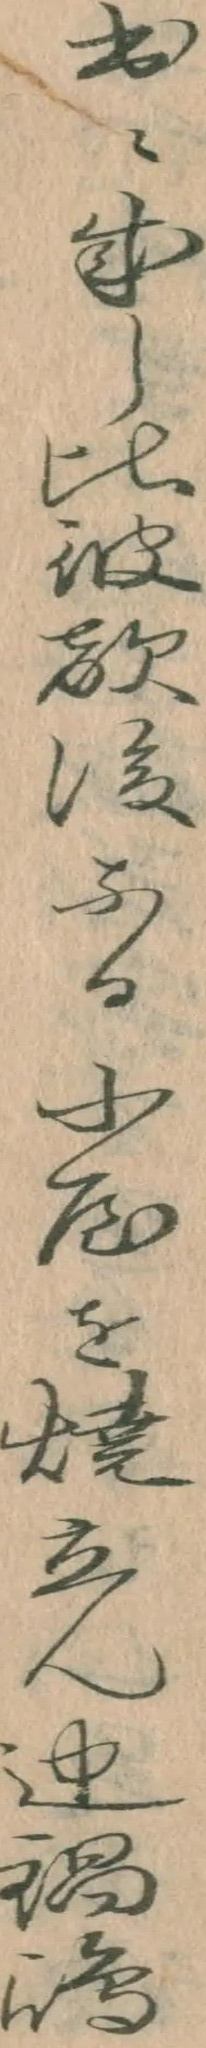出に成し比彼敵後なる小屋を焼立ん迚鍋島
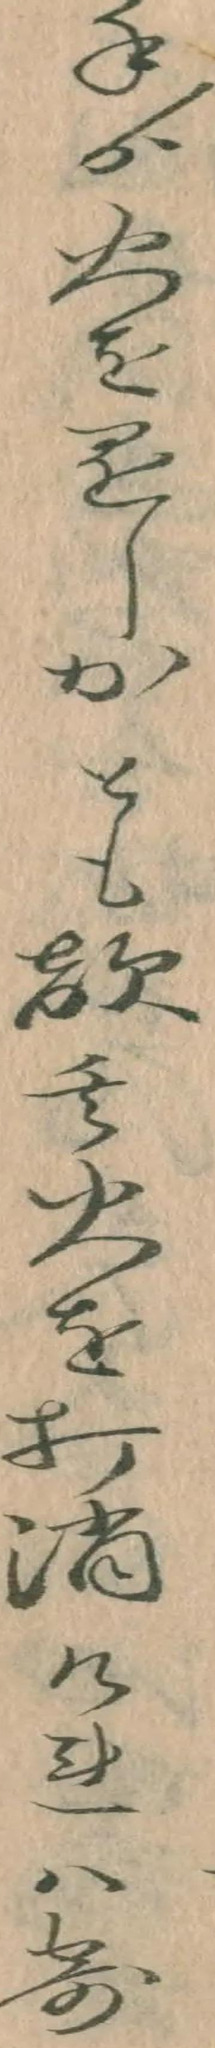手ゟ火を懸しかとも敵其火を打消け連は寄
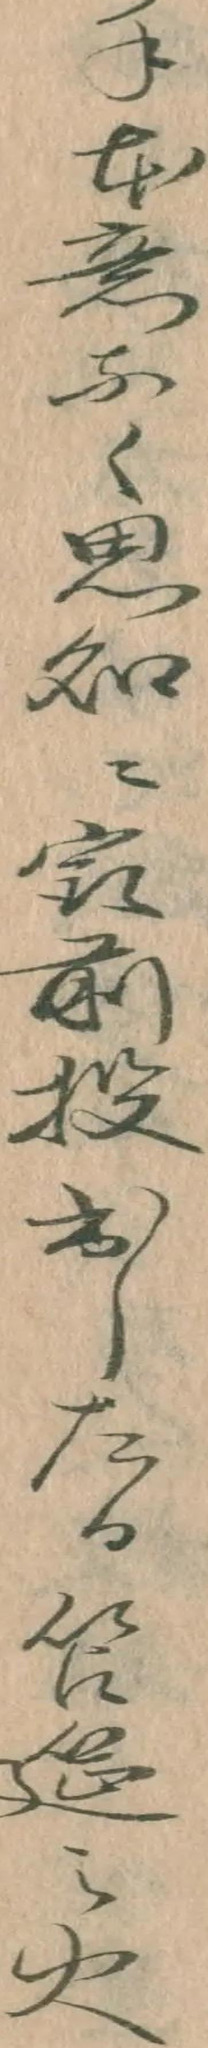手本意なく思処に最前投出したる苫筵之火
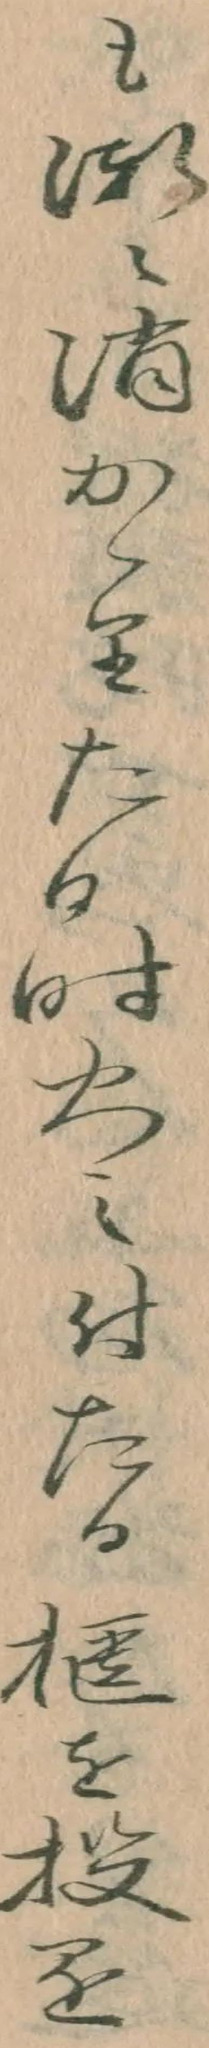も漸々消かゝ里たる時火之付たる櫃を投懸
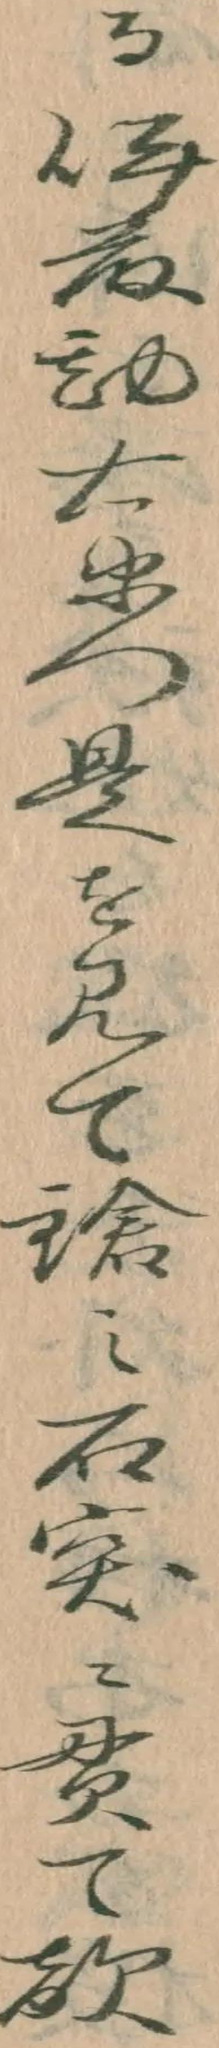る伊藤勘右衛門是を見て鎗之石突に貫て敵
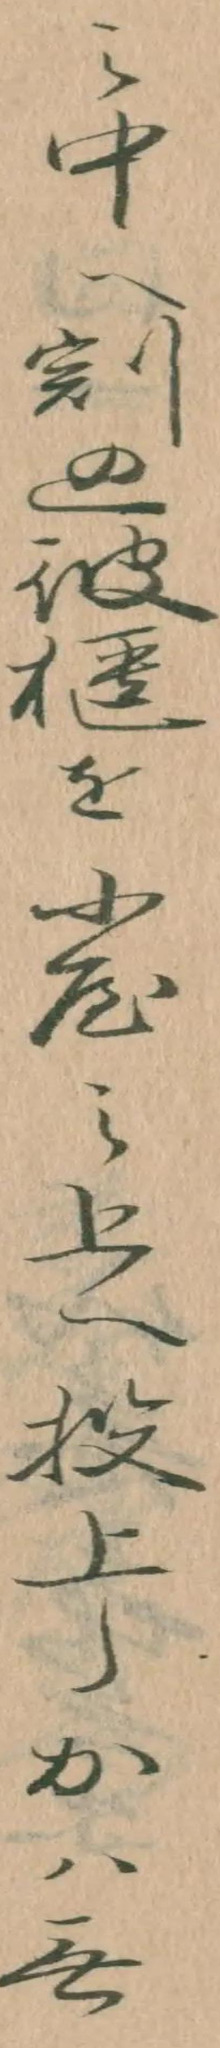之中へ割込彼櫃を小屋之上へ投上しかは無
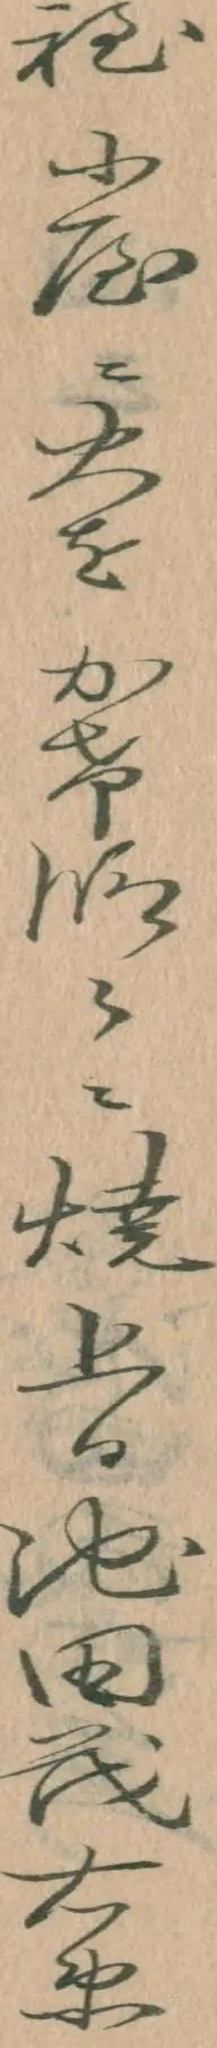程小屋に火を加希段々に焼上る池田茂右衛
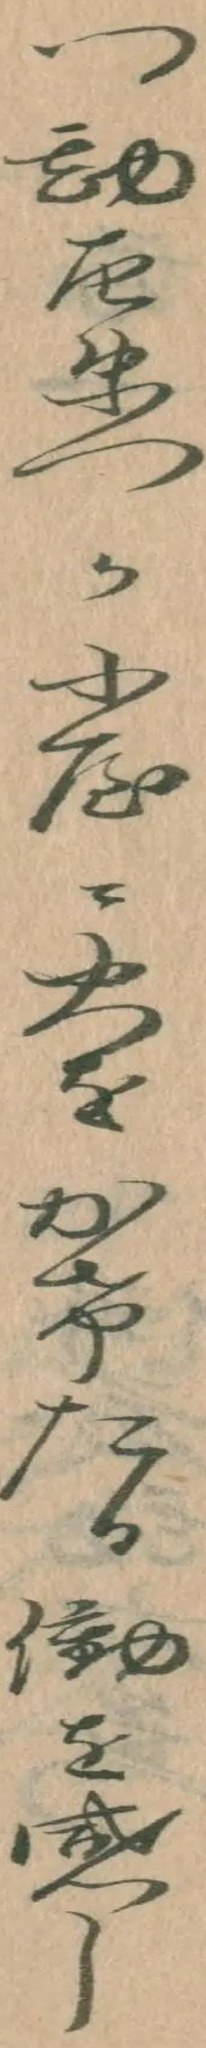門勘左衛門か小屋に火を加希たる働を感し
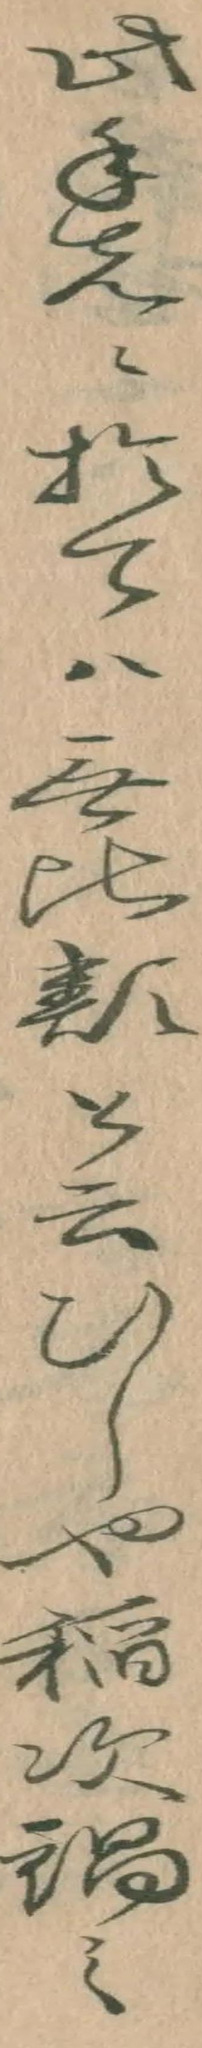此手先に於ては無比類と云ひし也稲次鍋之
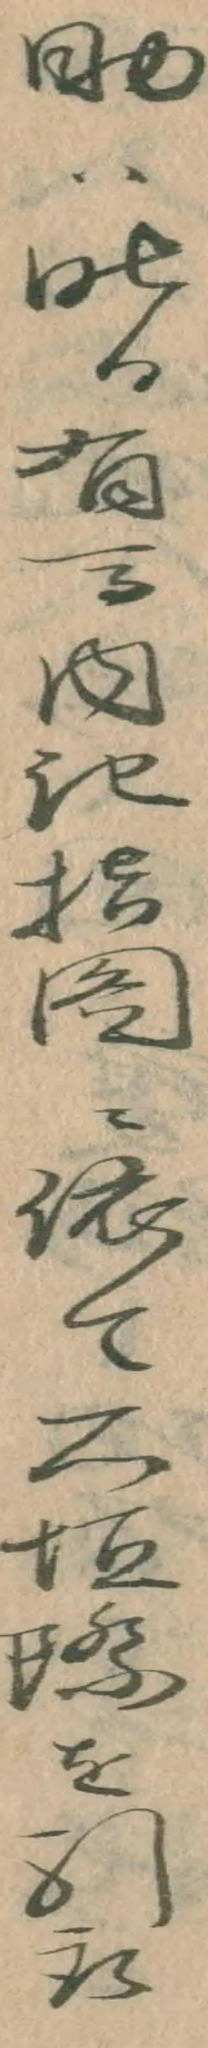助は昨日有馬内記指図に依て石垣際を引取
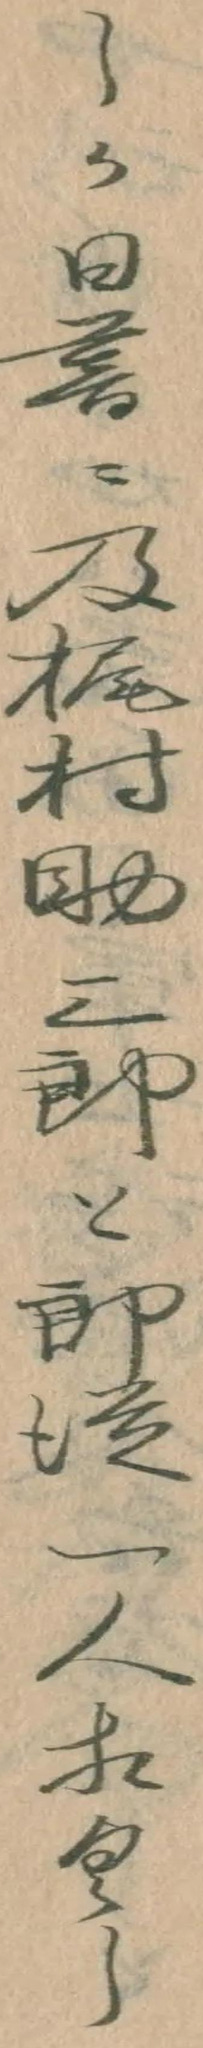しか日暮に及梶村助三郎と郎従一人相具し
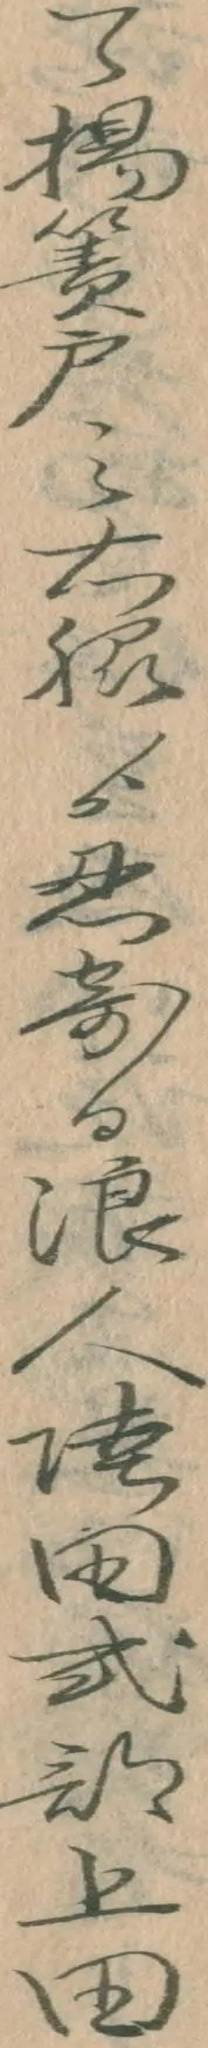て揚簀戸之右脇ゟ忍寄る浪人陸田式部上田
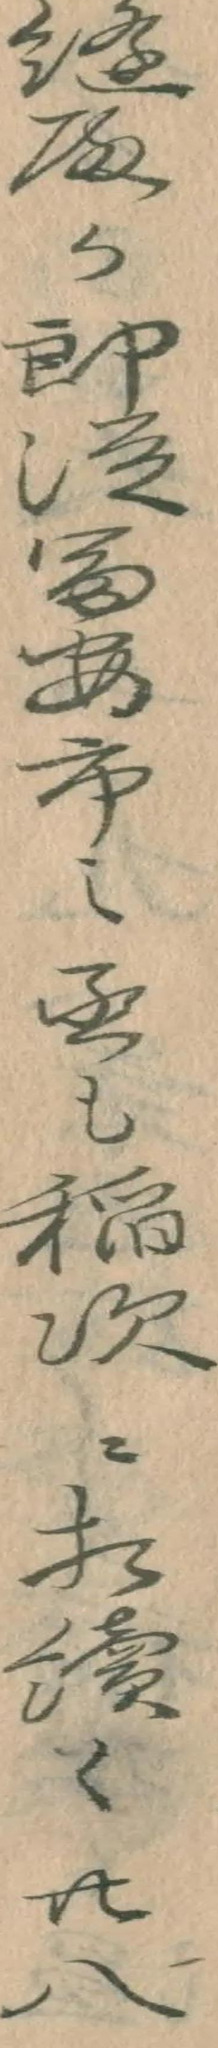縫殿か郎従冨安市之丞も稲次に相続く廿八
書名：切支丹御退治記 49巻. [9]
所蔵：国立国会図書館 National Diet Library, JAPAN
